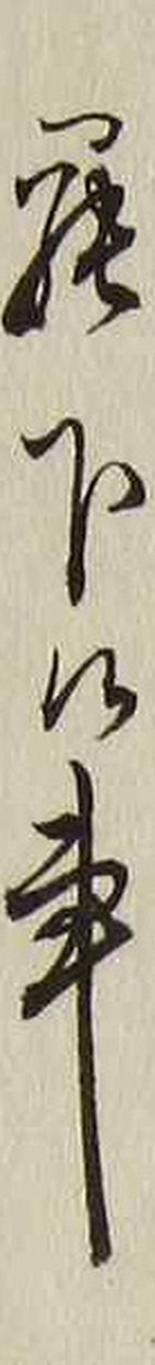罷下候事
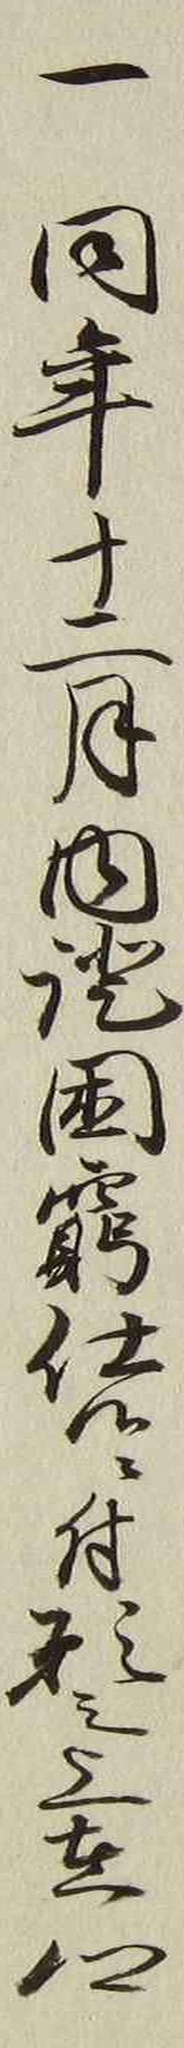一同年十二月内証困窮仕候ニ付願之上在郷
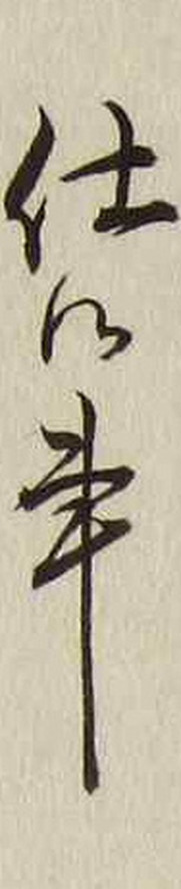仕候事
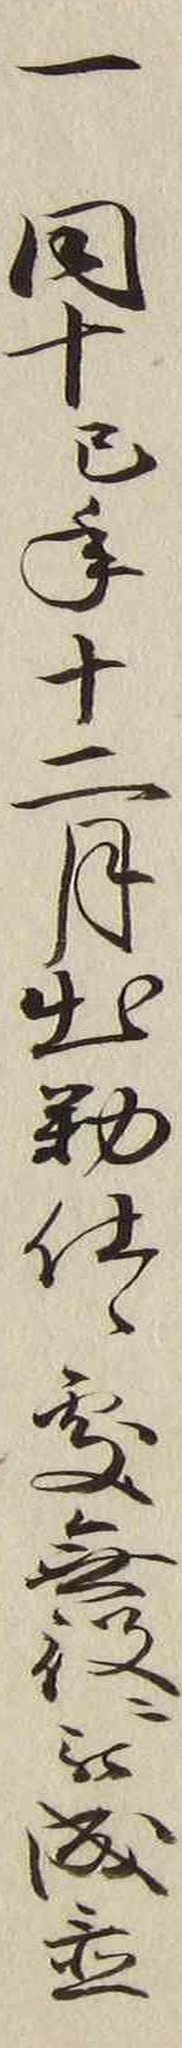一同十巳年十二月出勤仕候処無役ニ被成置
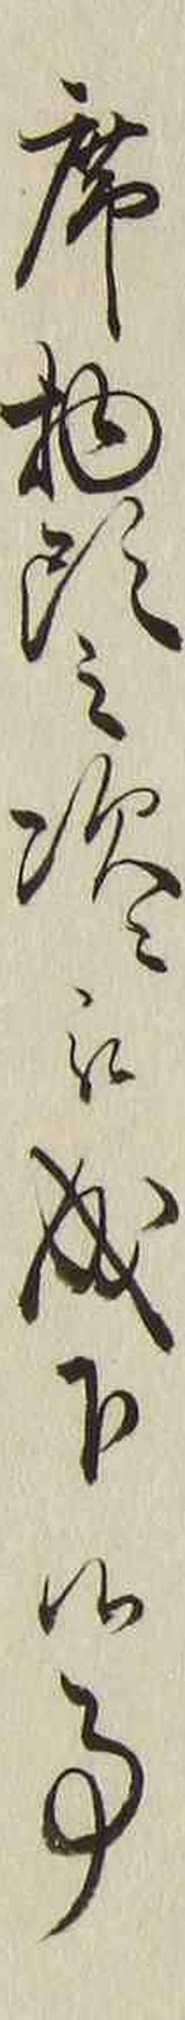席物頭之次ニ被成下候事

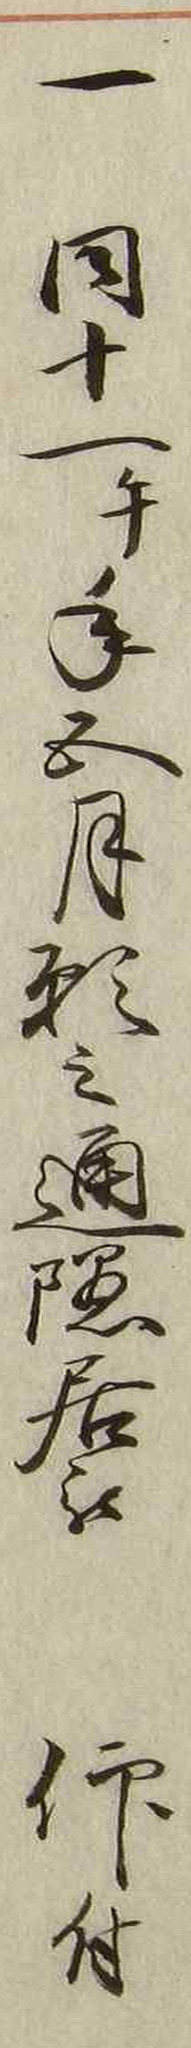一同十一午年五月願之通隠居被仰付
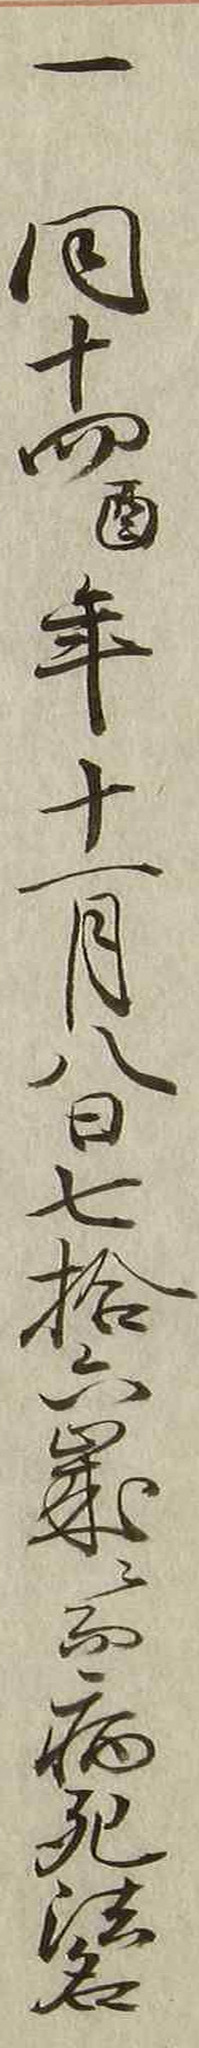一同十四酉年十一月八日七拾六歳ニ而病死法名
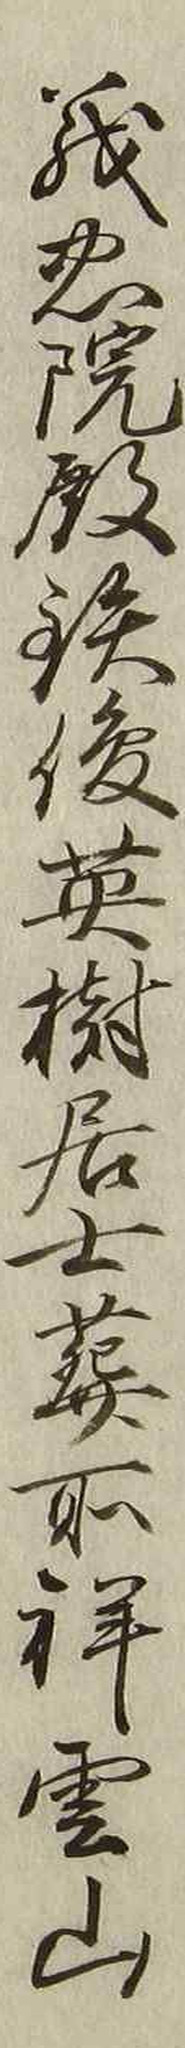義忠院殿鉄俊英樹居士葬所祥雲山
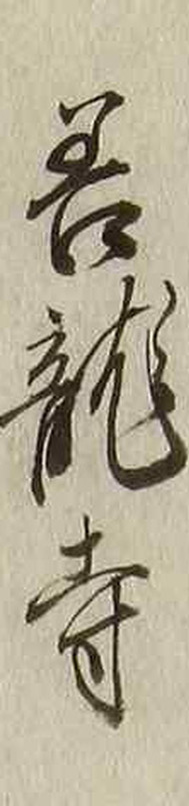善竜寺
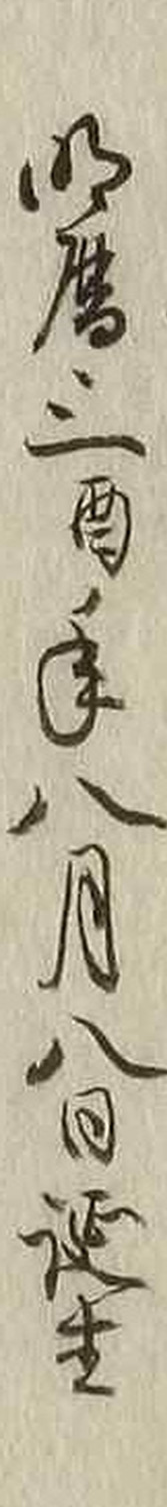明暦三酉年八月八日誕生
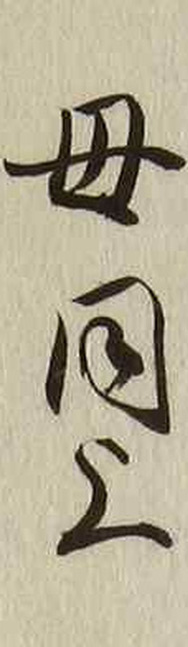母同上
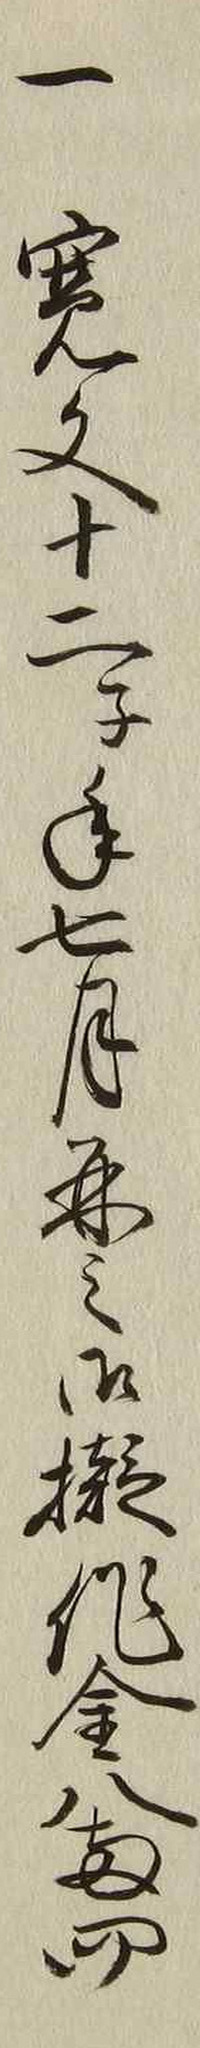一寛文十二子年七月再之御擬作金八両四
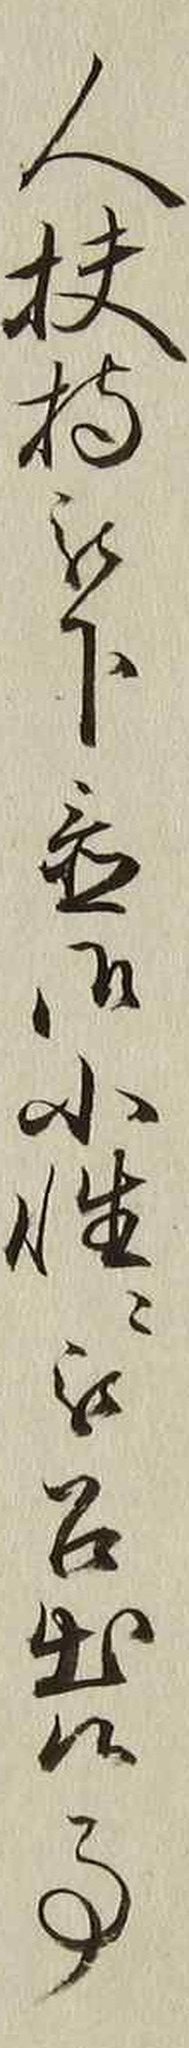人扶持被下置候小性ニ被召出候事
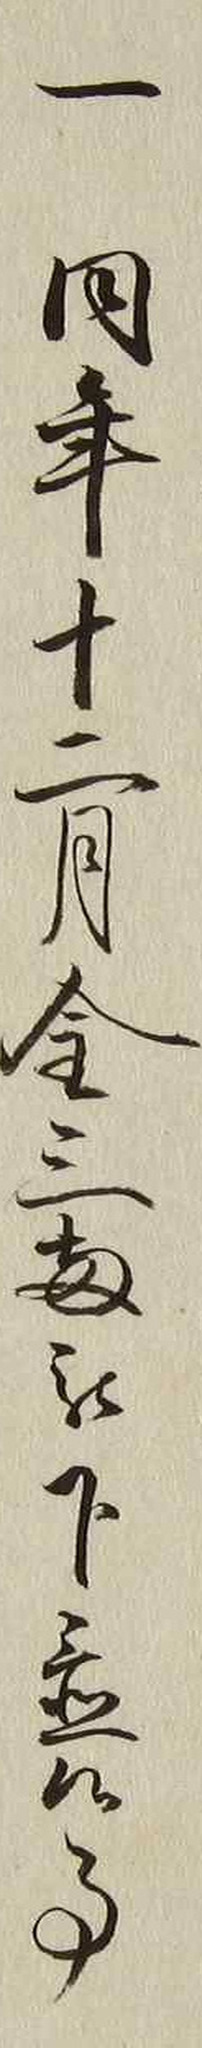一同年十二月金三両被下置侯事
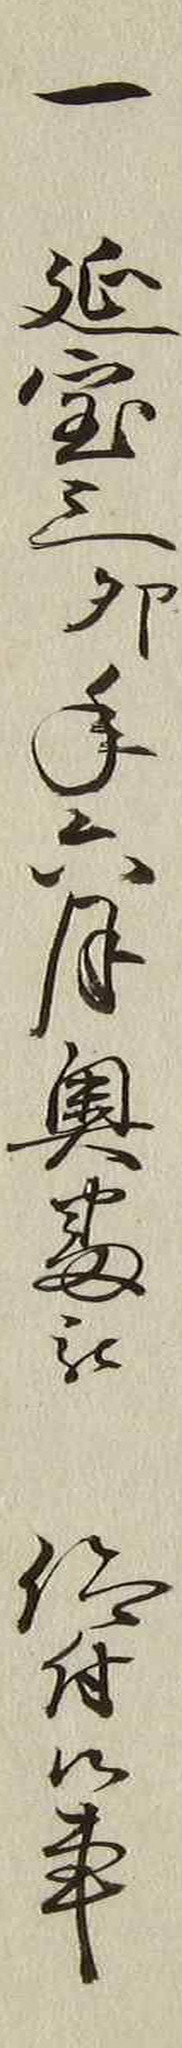一延宝三卯年六月奥番被仰付侯事
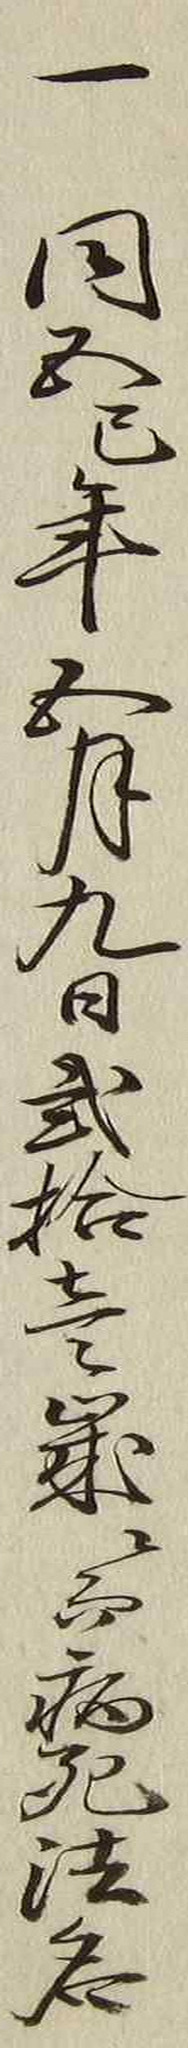一同五巳年五月九日弐拾壱歳ニ而病死法名
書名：諸士系譜　巻之21　い之部21
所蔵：会津若松市立会津図書館
